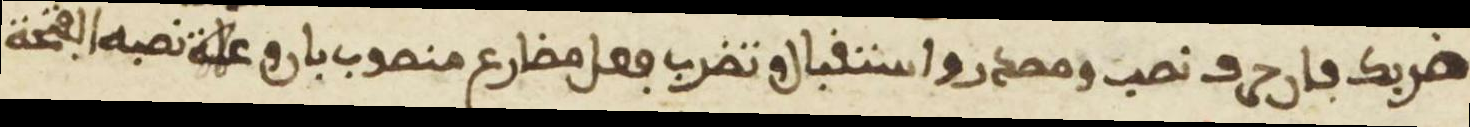ضربك فان حرف نصب و مصدر و استقبال و تضرب فعل مضارع منصوب بان و نصبه الفتحة
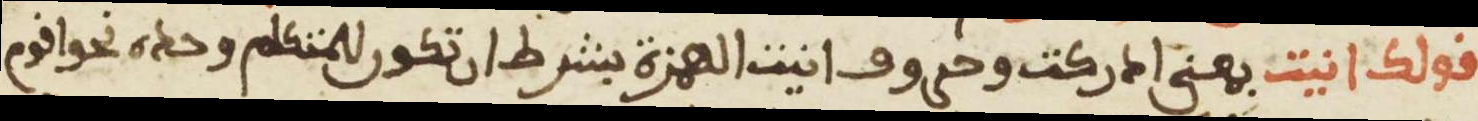قولك انيت بمعنى ادركت و حروف انيت الهمزة بشرط ان تكون للمتكلم وحده نحو اقوم
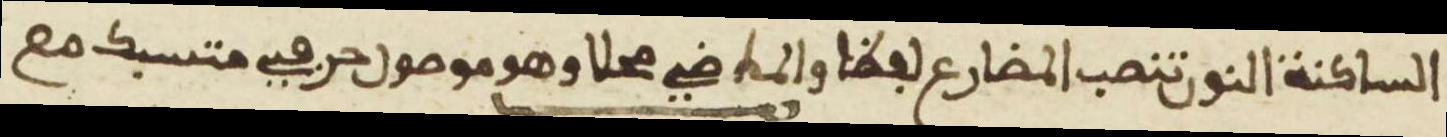الساكنة النون تنصب المضارع لفظا و الماضي محلا و هو موصول حرفي متسبد مع
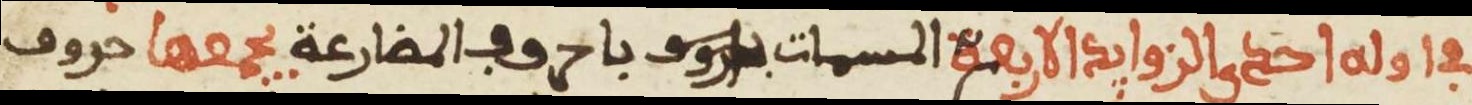في اوله احدى الزوايد الاربعة المسمات باحروف المضارعة يجمعها حروف
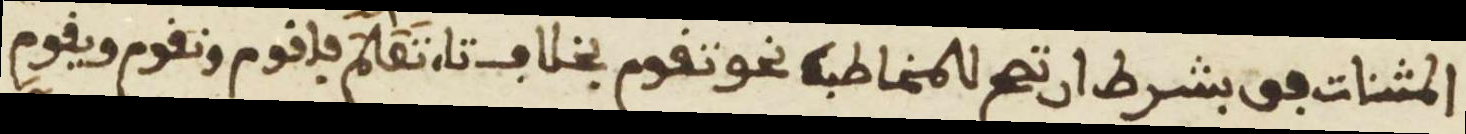المثنات فق بشرط ان تصح للمخاطب نحو تقوم بخلاف تاء تعلم فاقوم و نقوم و يقوم
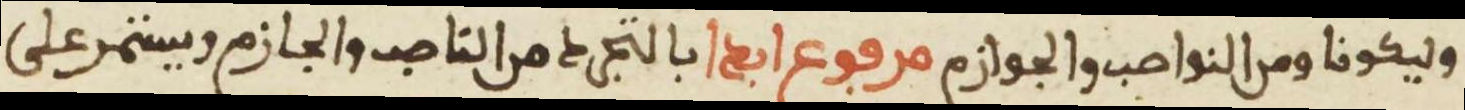و ليكونا و من النواصب و الجوازم مرفوع ابدا بالتجرد من الناصب و الجازم و يستمر على
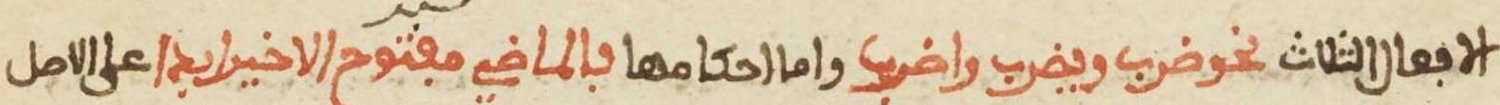الافعال الثلات نحو ضرب و يضرب و اضرب و اما احكامها فالماضي مفتوح الاخير ابدا على الاصل
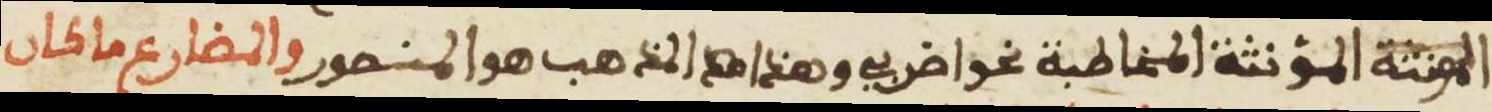المونثة المؤنثة المخاطبة نحو اضربي و هذا المذهب هو المنصور و المضارع ما كان
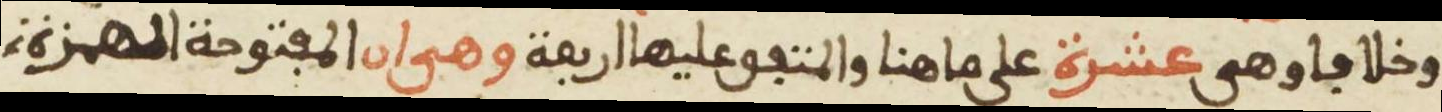و خلافا و هي عشرة على ما هنا و المتفق عليها اربعة و هي ان المفتوحة الهمزة
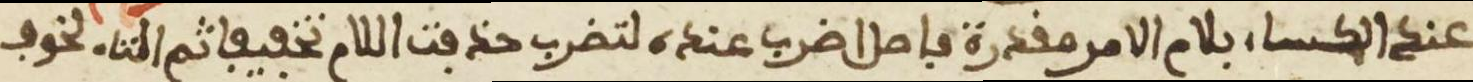عند الكساء بلام الامر مقدرة فاصل اضرب عنده لتضرب حذفت اللام تخفيفا ثم التاء فخوف
